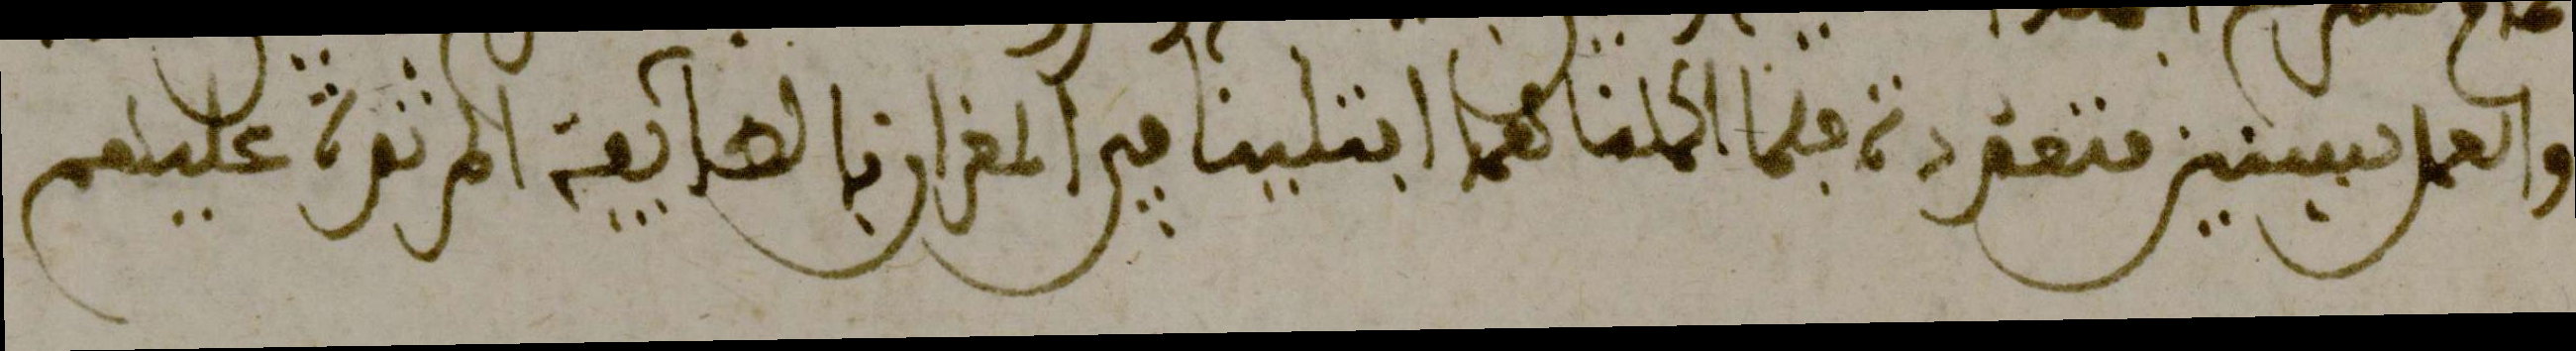والعمل بسنين متعددة فلما اكملناهما بتلينا في المغراز بالطايفة المرتدة عليهم
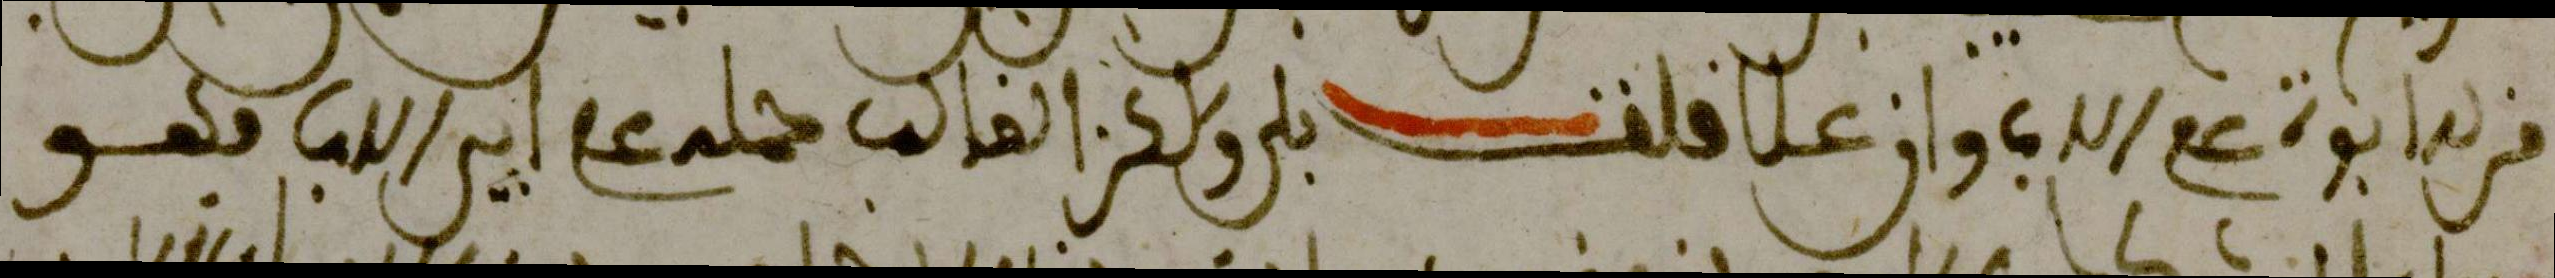من له ابوة على الاب وان علا قلت بلى ولكن الغالب حمله على ابي الاب فهو
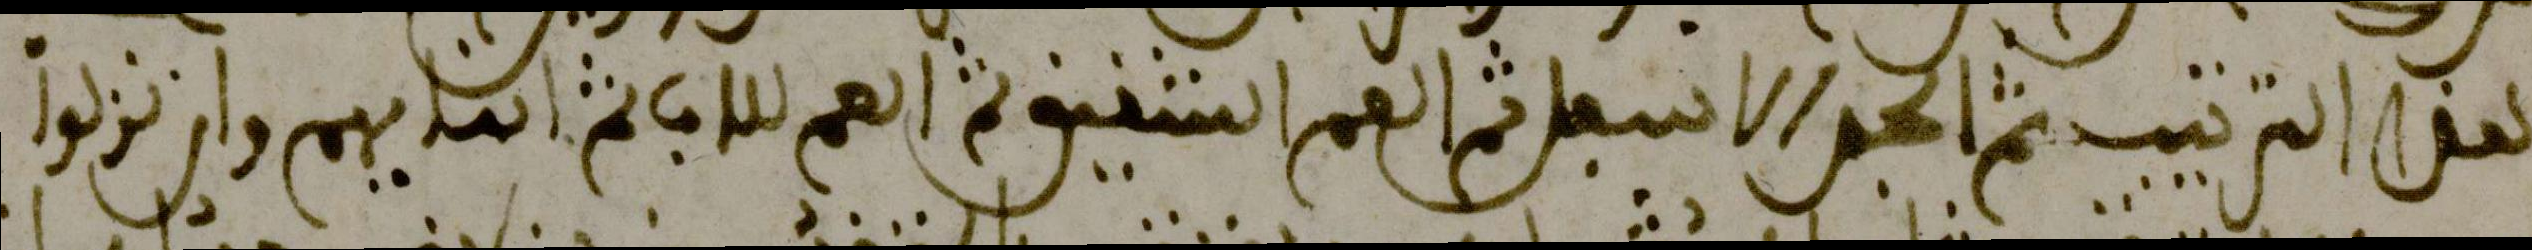هذا الترتيب ثم الجد الاسفل ثم العم الشقيق ثم العم للاب ثم ابنايهم وان نزلوا
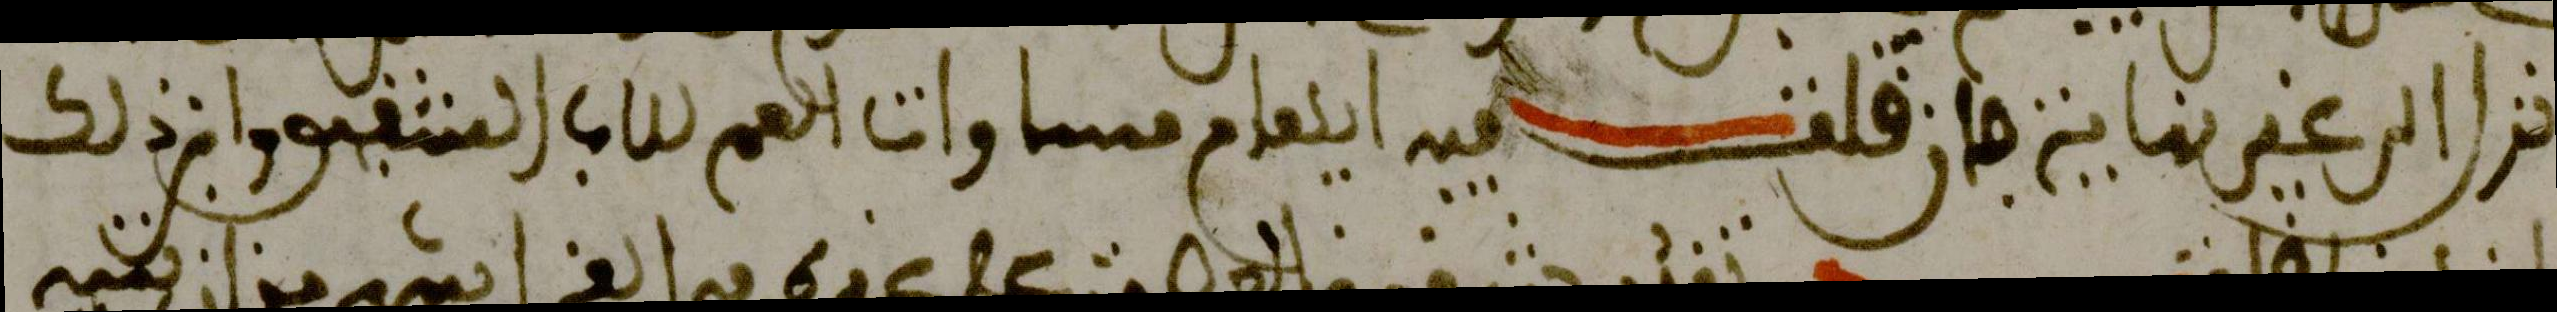نزل الى عير بناية فان قلت فيه ايهام مساوات العم للاب الشقيق وابن ذلك
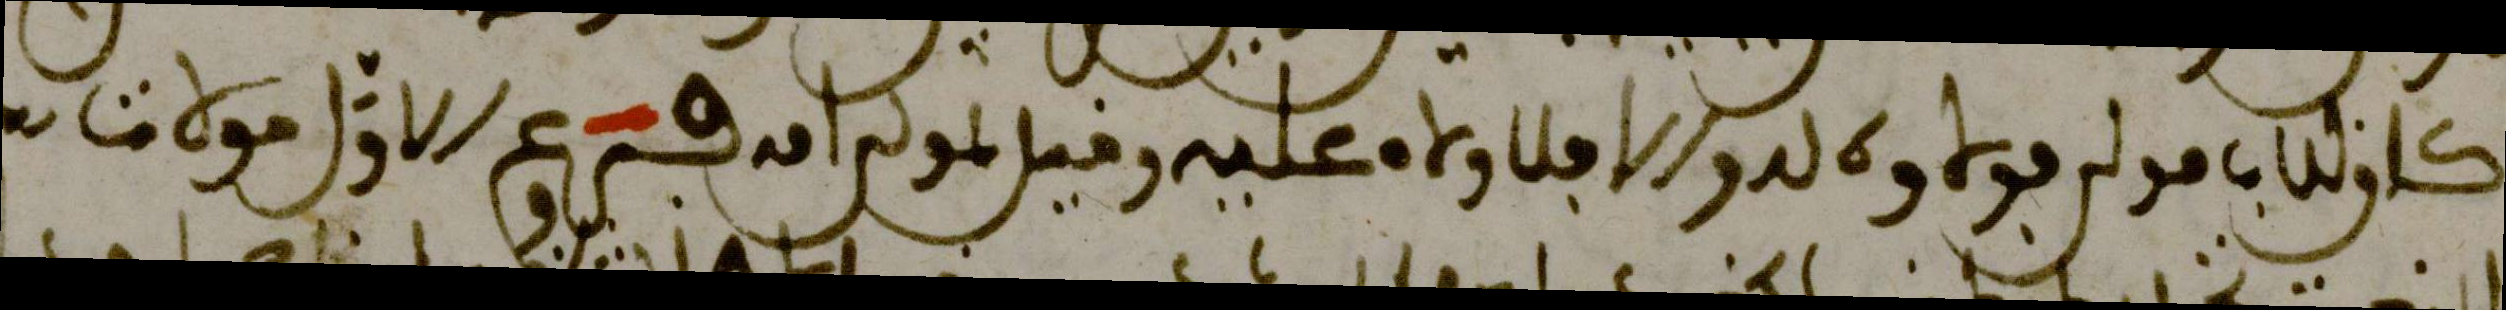كان للاب مولى فولاوه له والا فلا ولاء عليه وقيل لمولى امه فرع الاوّل مولات
